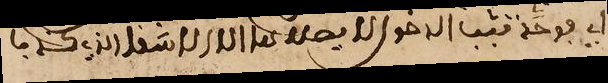اي فوحد تبب الدخول لا يصلاها الا الاشقا الذي كذب
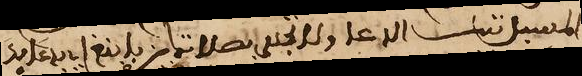المسبل تبب الدعاء ولاتجهر بصلاتك ين بابنغ اي بدعايك
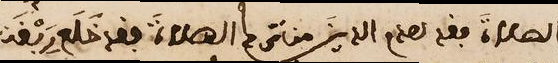الصلاة فقد هدم الدين من ترك الصلاة فقد خلع ربقة
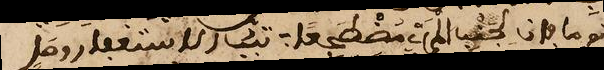نوما فان لجنب المري مضطجعا تبب الاستغفار وصل
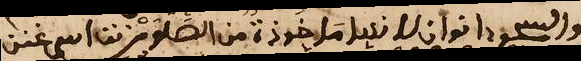والسجود انوان لانها ماخوذة من الصلوين نن اسرغنن
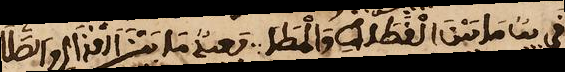قريب ما بين القطاط والمطا بعيد ما بين القذال والصلا
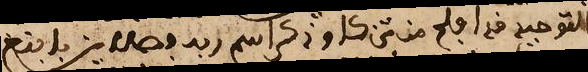التوحيد قد افلح من تزكا وذكر اسم ربه فصلا ين بابنغ
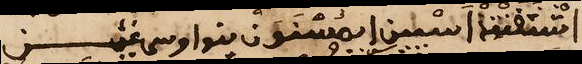اشنتقنتذ آسيين ايمسنون ينوا وسرغينن
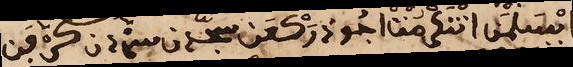ايسلمن اتنكرمنت اجوذ ركعن سجدن سردن كرفن
